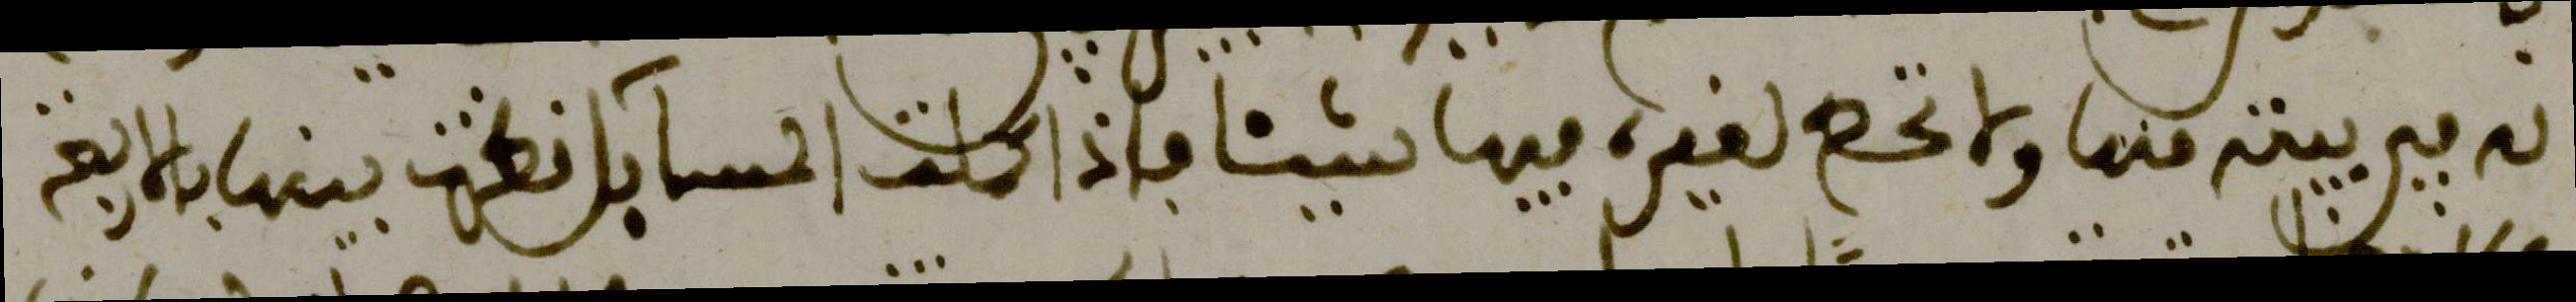له في بيته منها ولا تحط لغيره فيها شيئا فاذا كملت المسائل نظرت بينها بالاربعة
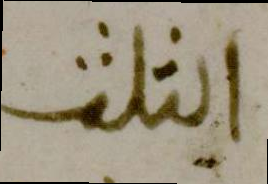الثلث
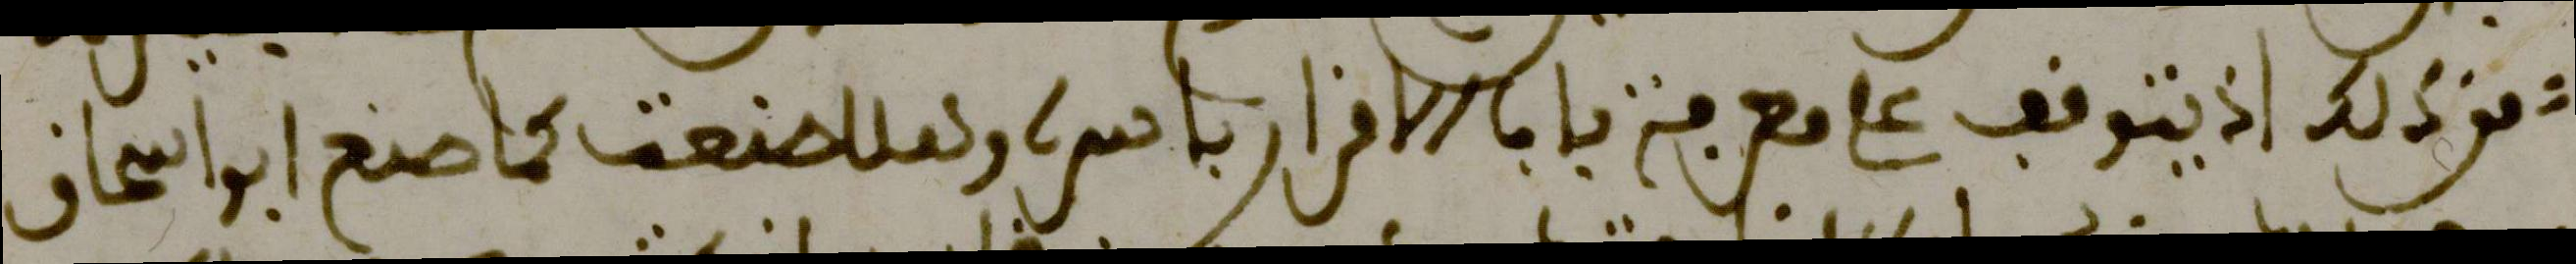من ذلك اذ يتوفق على معرفة باب الاقرار باسره وهلا صنعت كما صنع ابو اسحاق
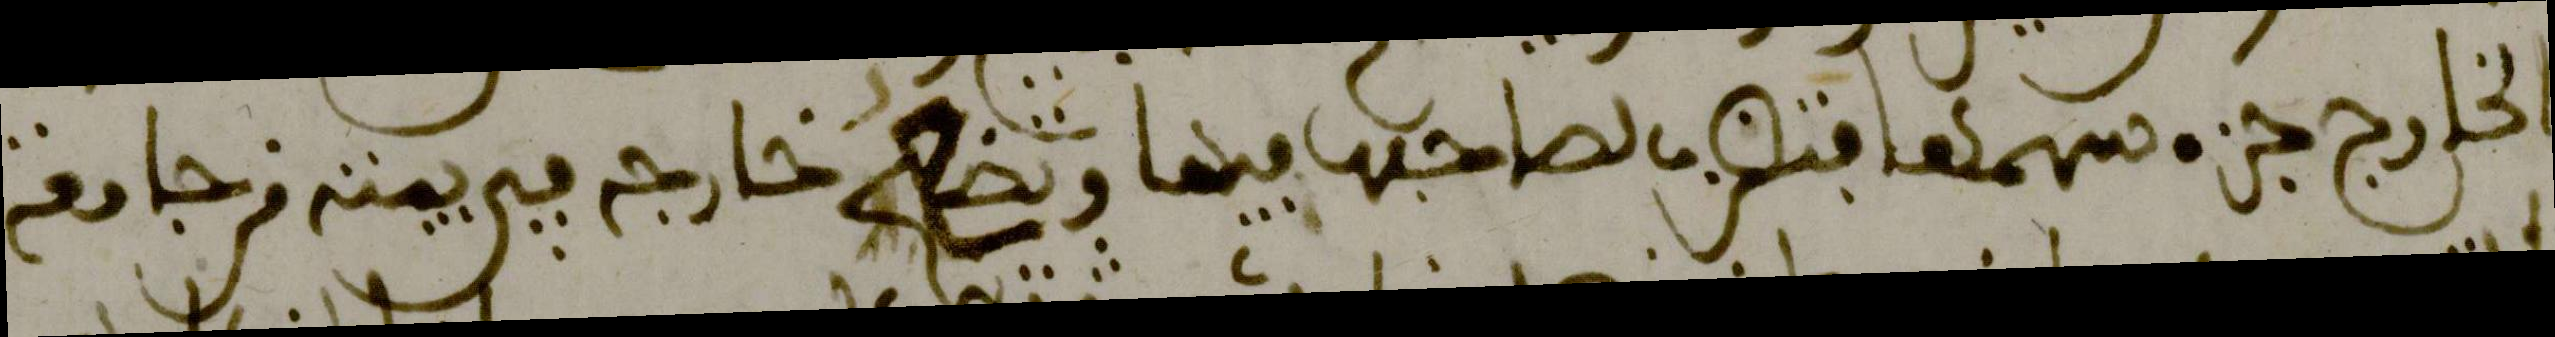الخارج جزء سهمها فتضرب لصاحبها فيها وتض# خارجه في بيته من جامعة
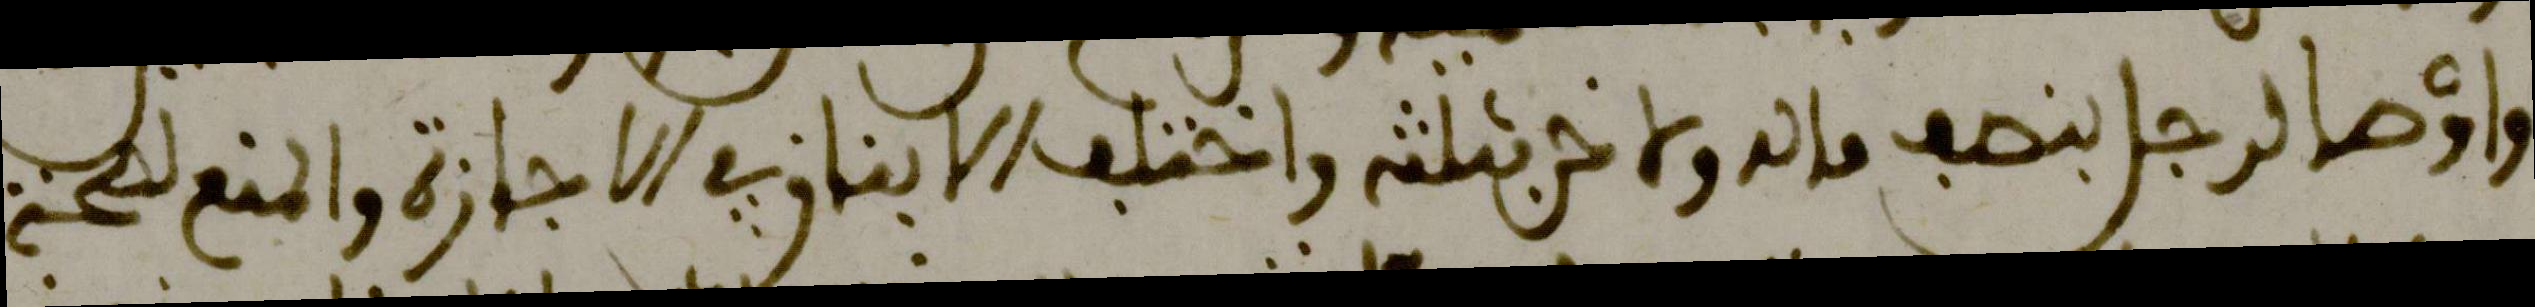واوْصا لرجل بنصف ماله ولاخر بثلثه واختلف الابنان في الاجارة والمنع لصحة
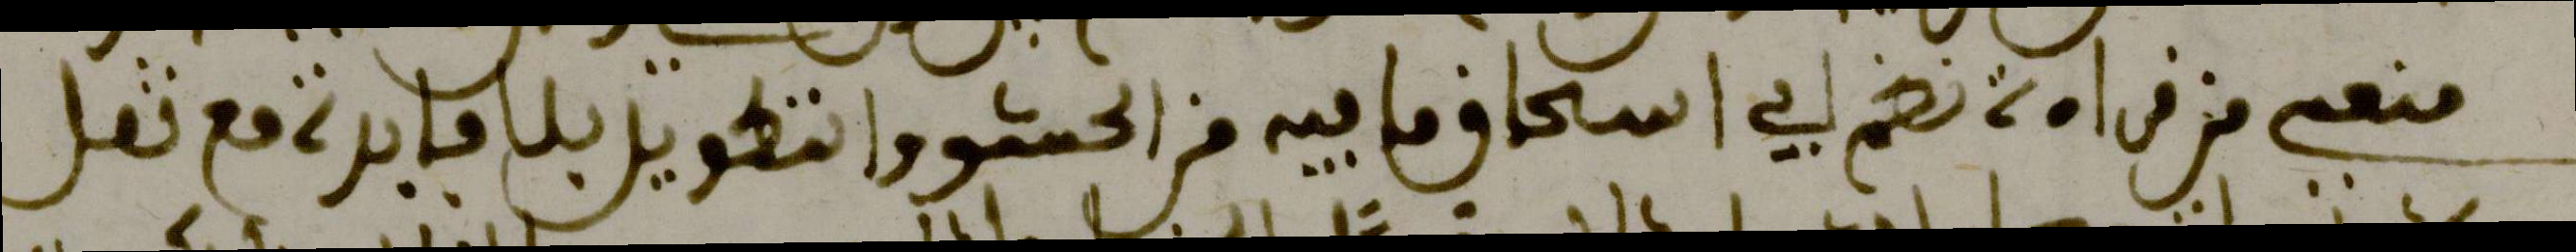منعني من قراءة نظم ابي اسحاق ما فيه من الحشو والتطويل بلا فائدة مع ثقل
